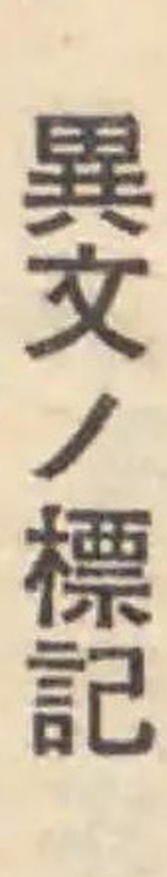異文ノ標記
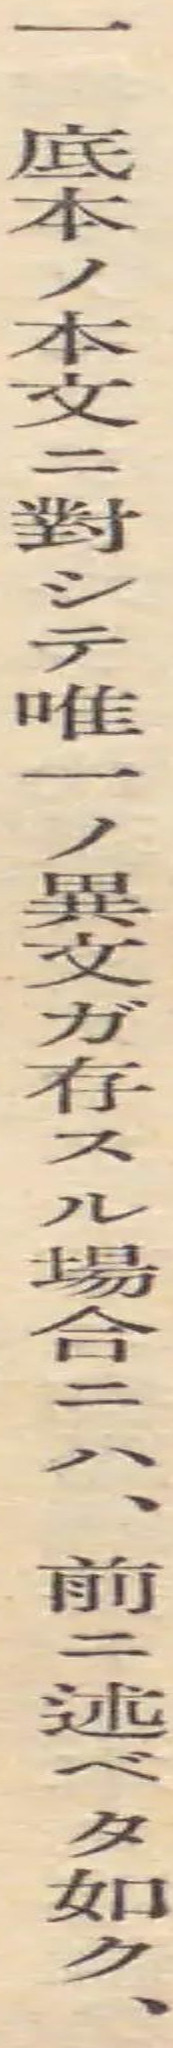一底本ノ本文に対シテ唯一ノ異文ガ存スル場合ニハ、前ニ述ベタ如ク、
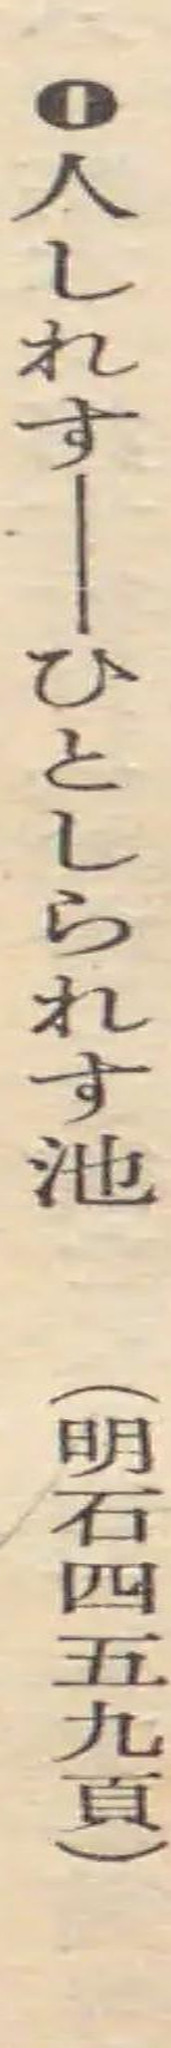❶人しれす──ひとしられす池(明石四五九頁)
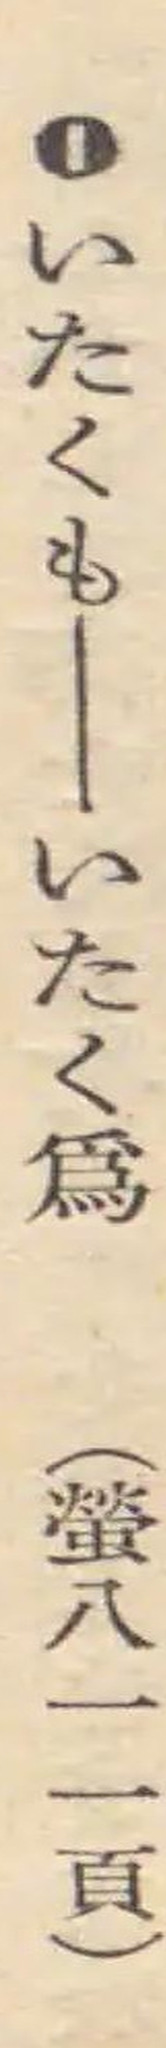❶いたくも──いたく為(蛍八一一頁)
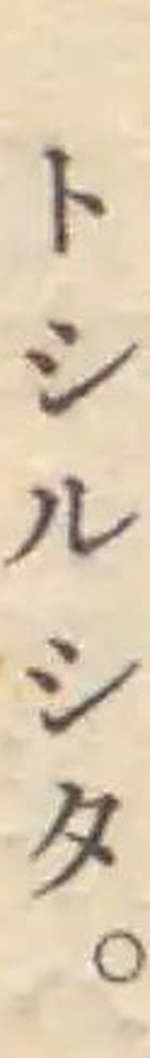トシルシタ。
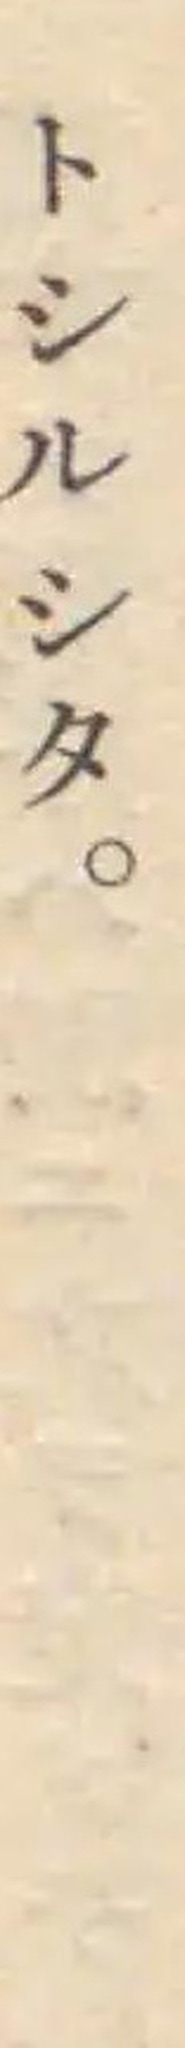トシルシタ。
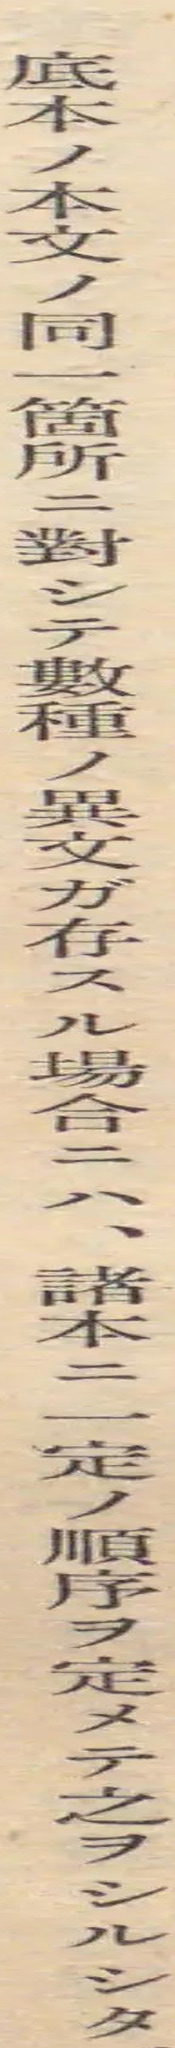一底本ノ本文ノ同一箇所に対シテ数種ノ異文ガ存スル場合ニハ、諸本ニ一定ノ順序ヲ定メテ之ヲシルシタ。
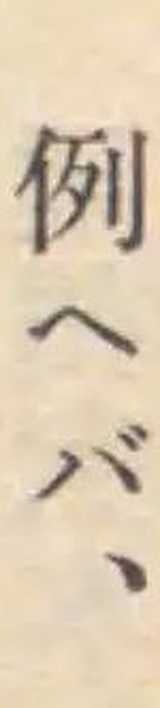例ヘバ、
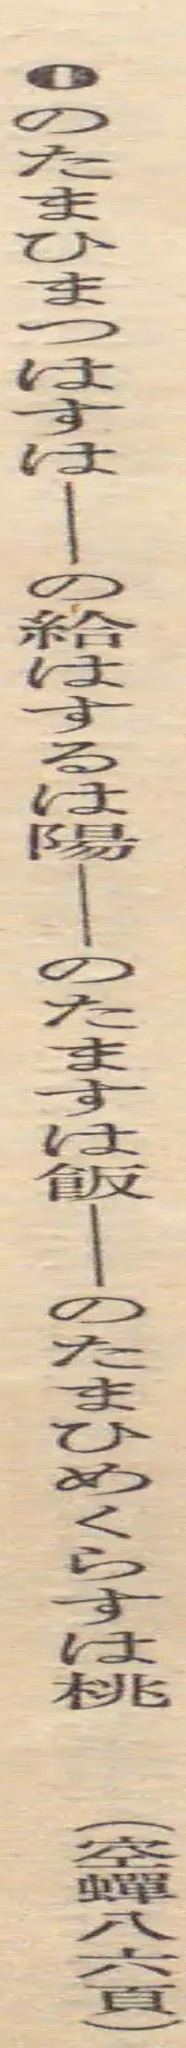❶のたまひまつはすは──の給はするは陽──のたますは飯──のたまひめくらすは桃(空蝉八六頁)
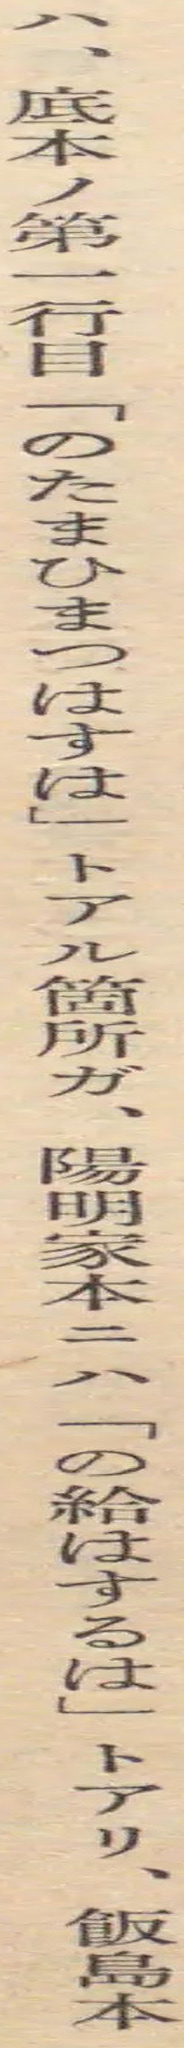ハ、底本ノ第一行目「のたまひまつはすは」トアル箇所ガ、陽明家本ニハ「の給はするは」トアリ、飯島本
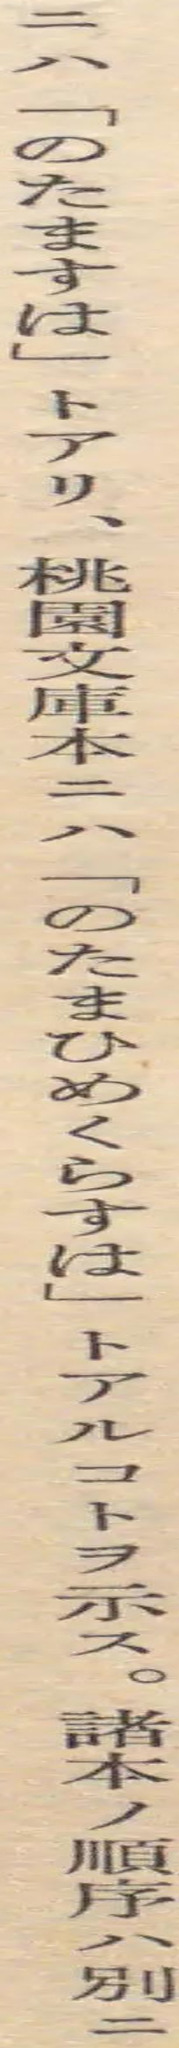ニハ「のたますは」トアリ、桃園文庫本ニハ「のたまひめくらすは」トアルコトヲ示ス。諸本ノ順序ハ別ニ
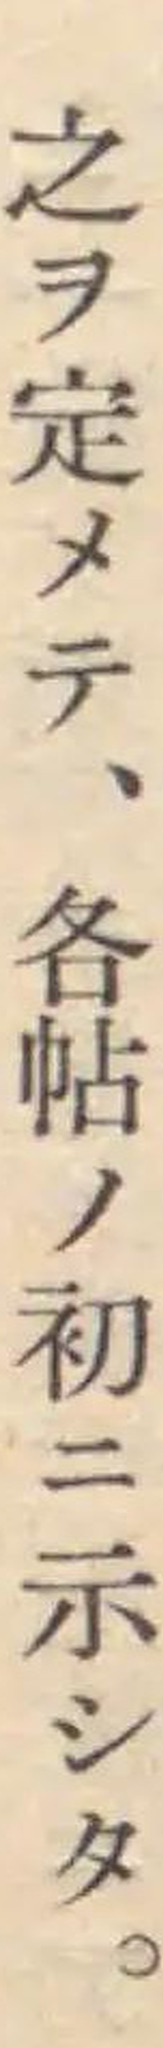之ヲ定メテ、各帖ノ初ニ示シタ。
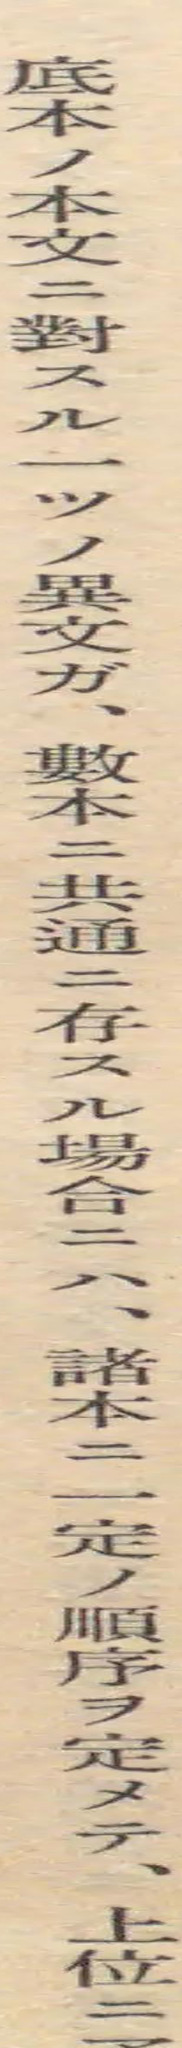一底本ノ本文ニ対スル一ツノ異文ガ、数本ニ共通ニ存スル場合ニハ、諸本ニ一定ノ順序ヲ定メテ、上位ニア
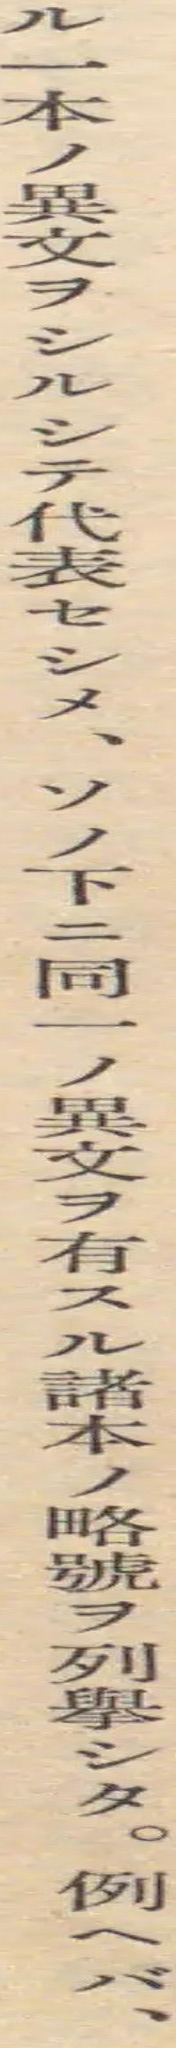ル一本ノ異文ヲシルシテ代表セシメ、ソノ下ニ同一ノ異文ヲ有スル諸本ノ略号ヲ列挙シタ。例ヘバ、
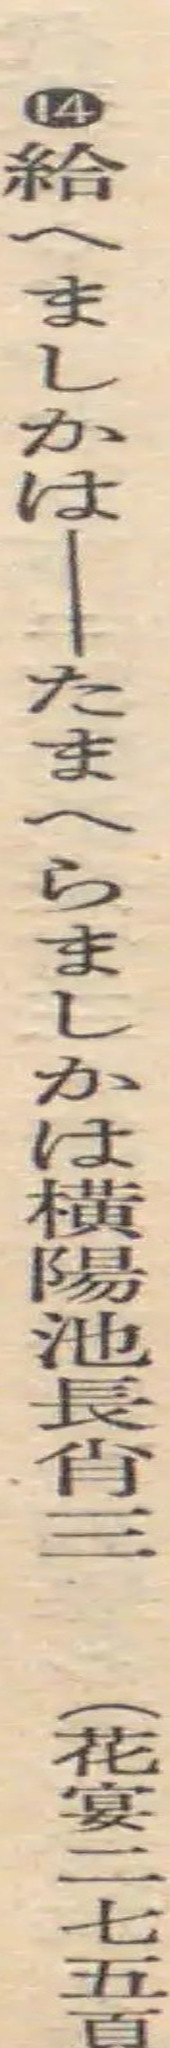⓮給へましかは──たまへらましかは横陽池長肖三(花宴二七五頁)
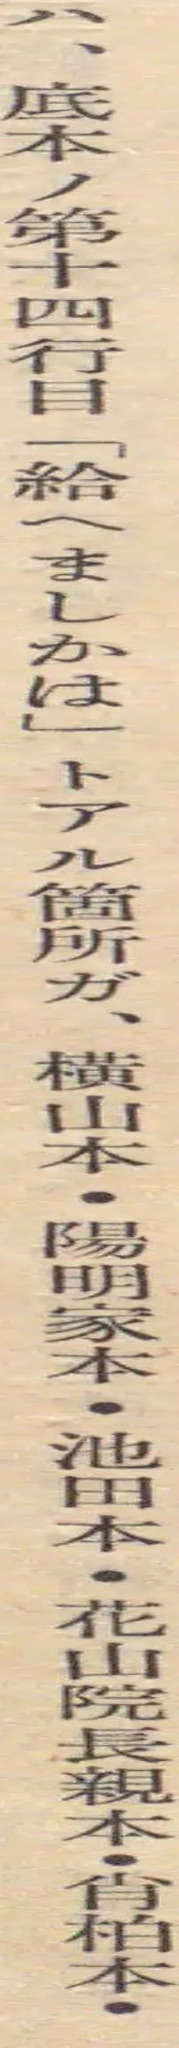ハ、底本ノ第十四行目「給へましかは」トアル箇所ガ、横山本・陽明家本・池田本・花山院長親本・肖柏本・
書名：校異源氏物語.
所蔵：国立国会図書館 National Diet Library, JAPAN
